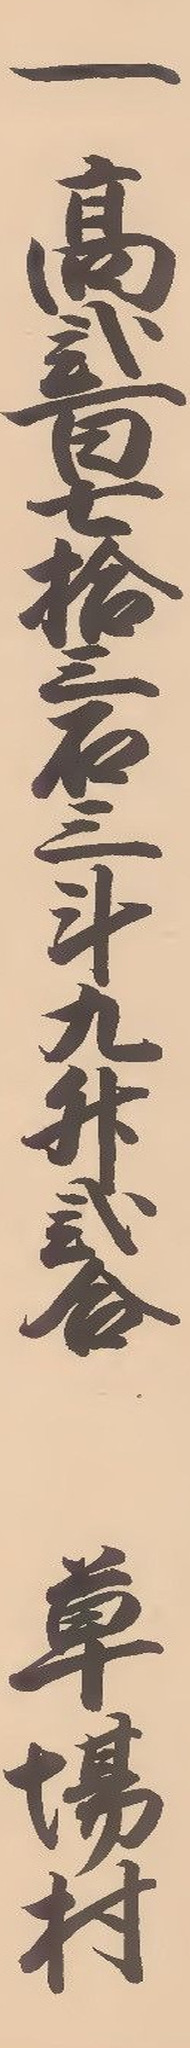一髙弐百七拾三石三斗九升弐合草場村
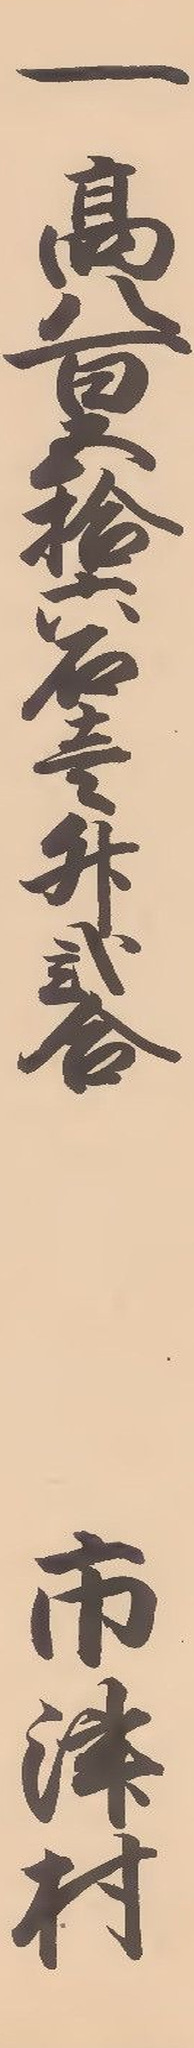一髙八百五拾六石壱升弐合市津村
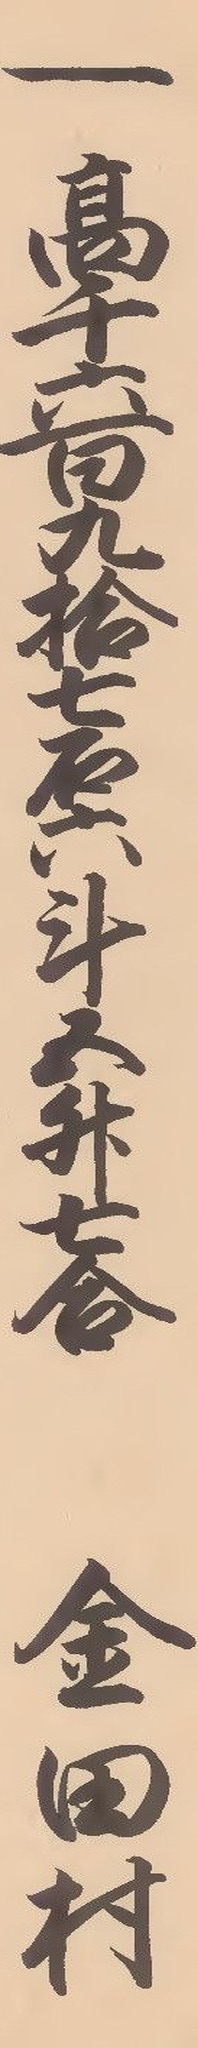一髙千六百九拾七石六斗五升七合金田村
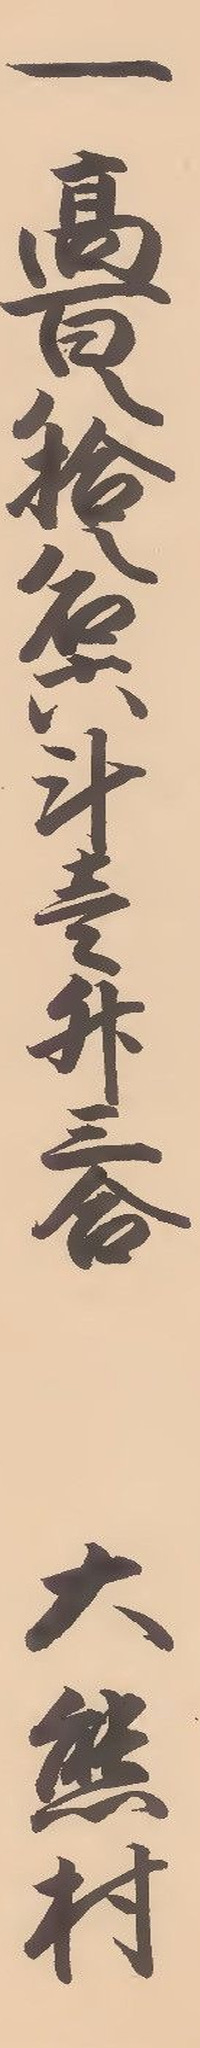一髙百八拾八石六斗壱升三合大熊村

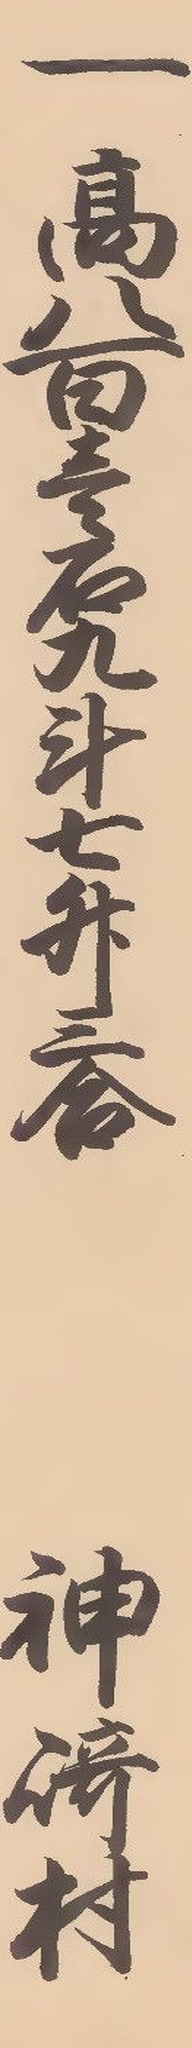一髙八百壱石九斗七升三合神崎村
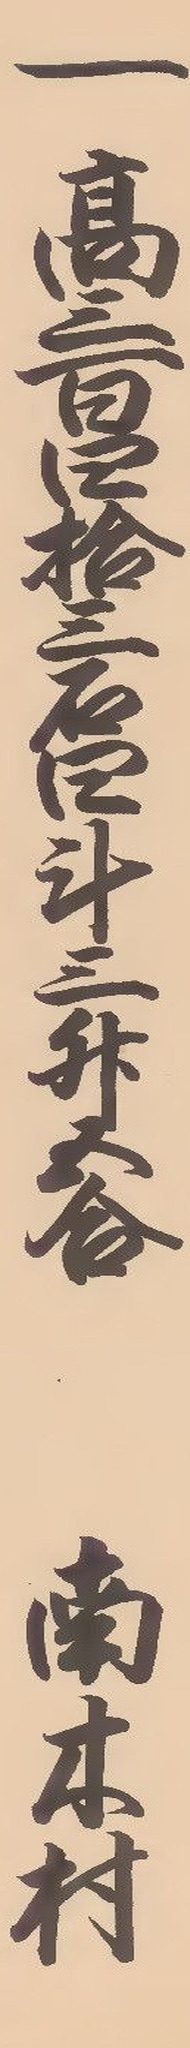一髙三百四拾三石四斗三升五合南木村
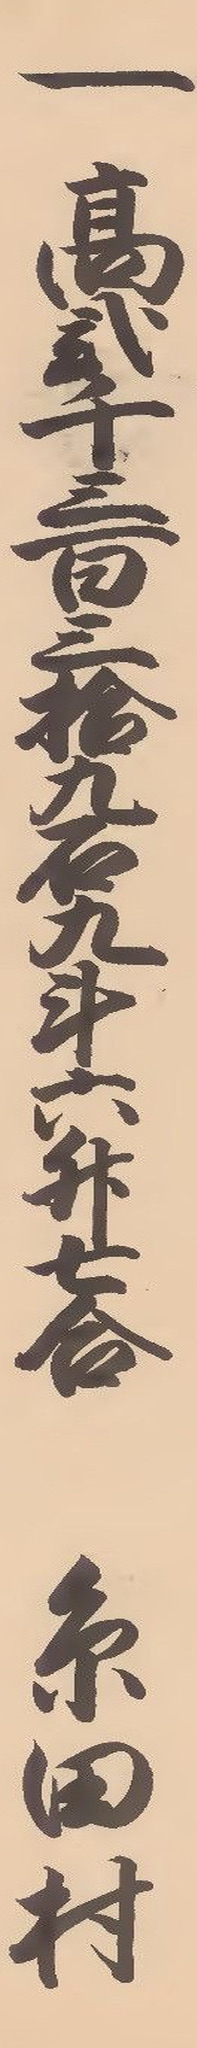一髙弐千三百三拾九石九斗六升七合糸田村
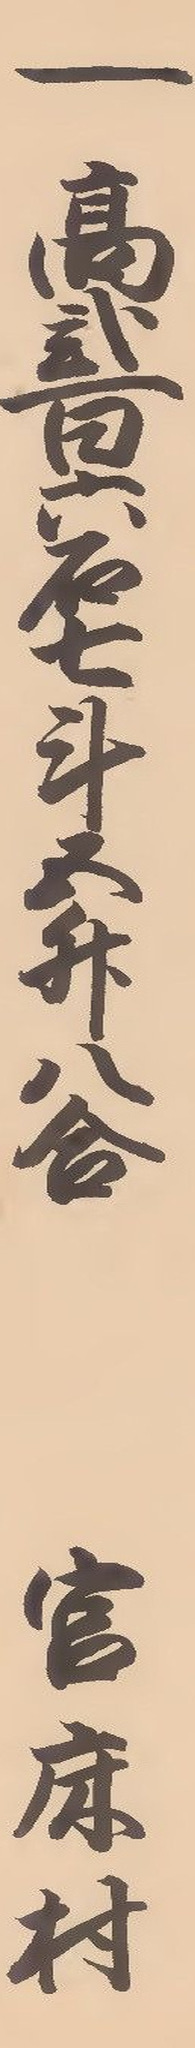一髙弐百六石七斗五升八合宮床村
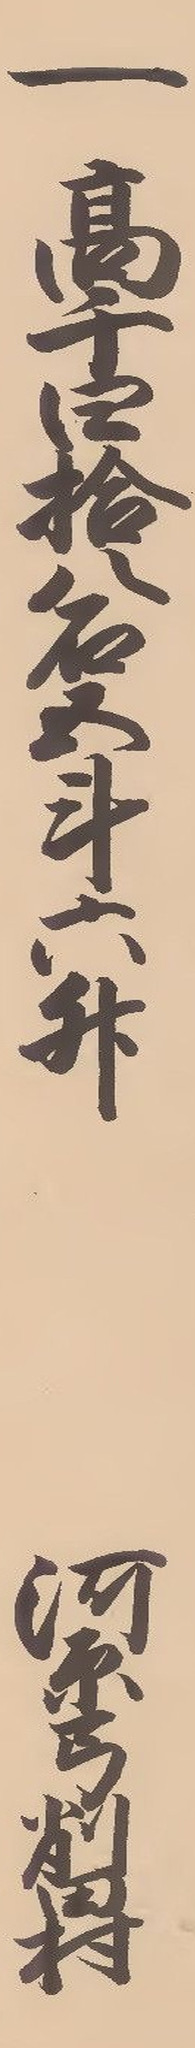一髙千四拾八石五斗六升河原弓削田村
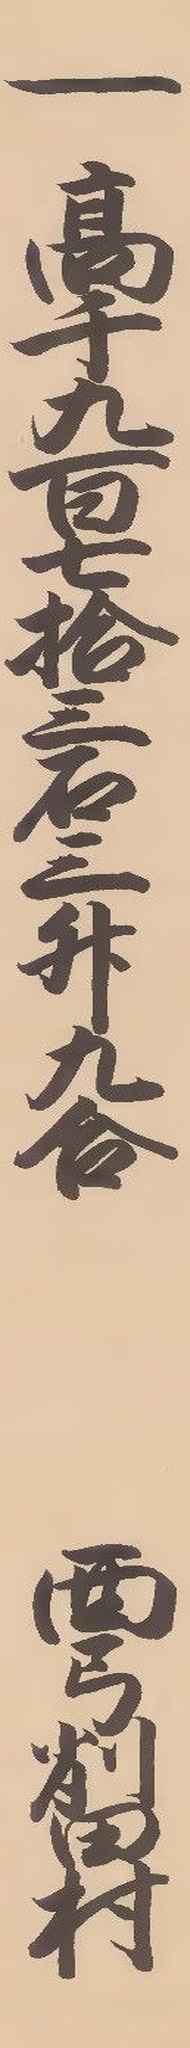一髙千九百七拾三石三升九合西弓削田村
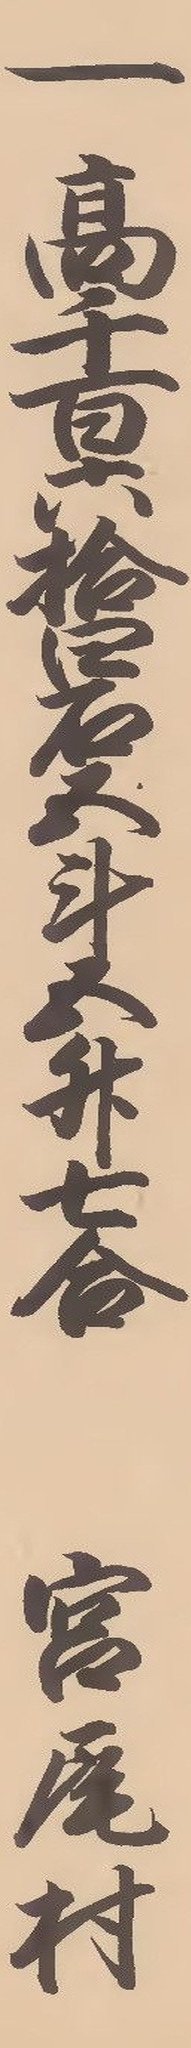一髙千百六拾四石五斗五升七合宮尾村
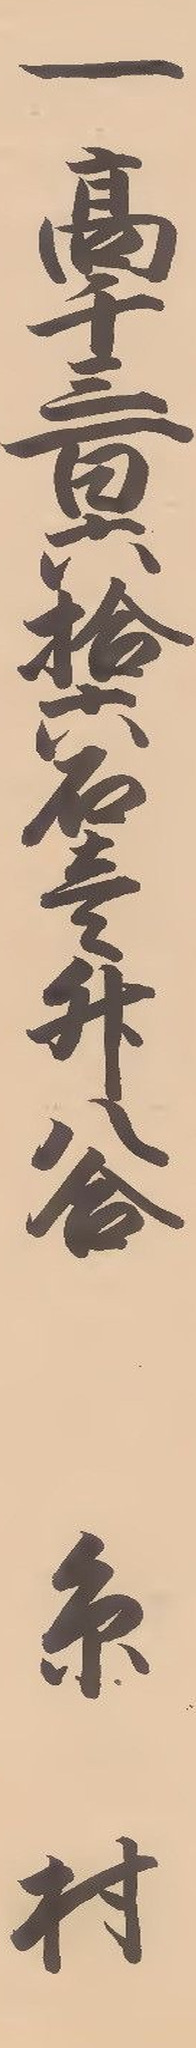一髙千三百六拾六石壱升八合糸村

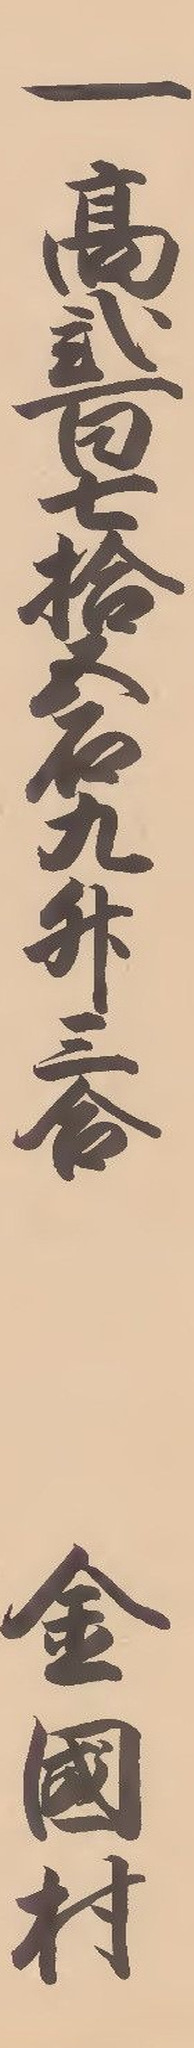一髙弐百七拾五石九升三合金國村
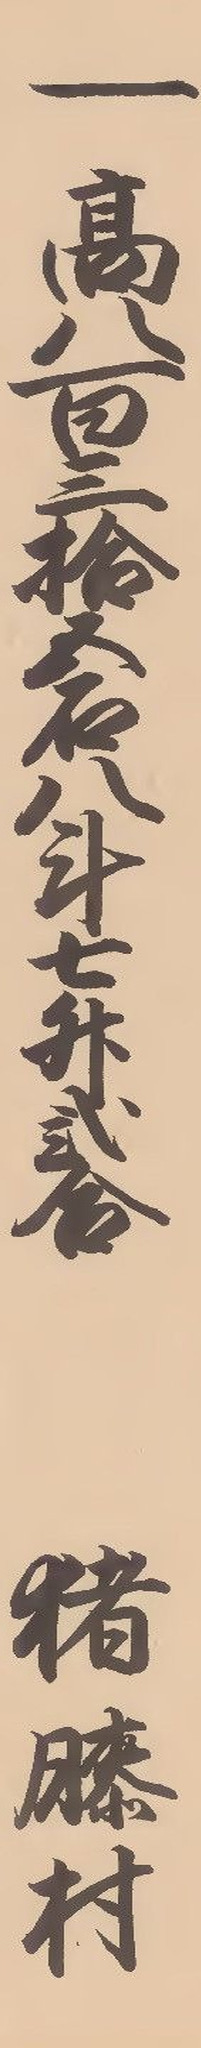一髙八百三拾五石八斗七升弐合猪膝村
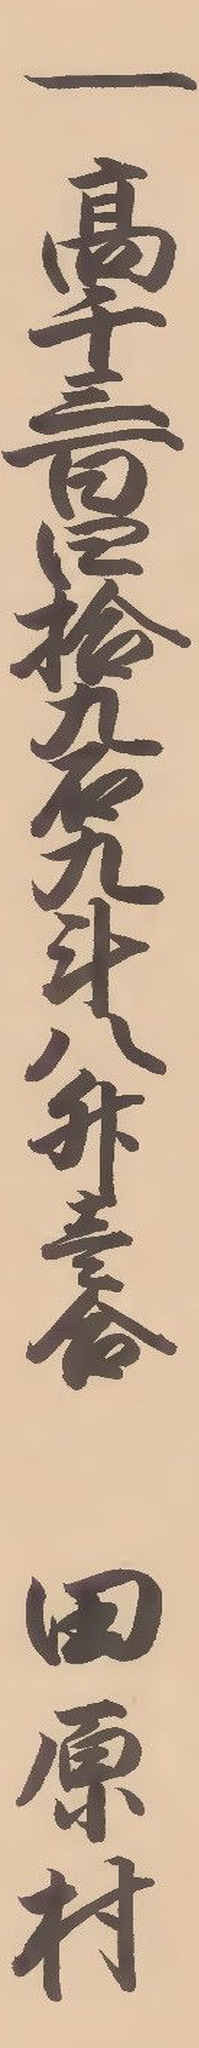一髙千三百四拾九石九斗八升壱合田原村
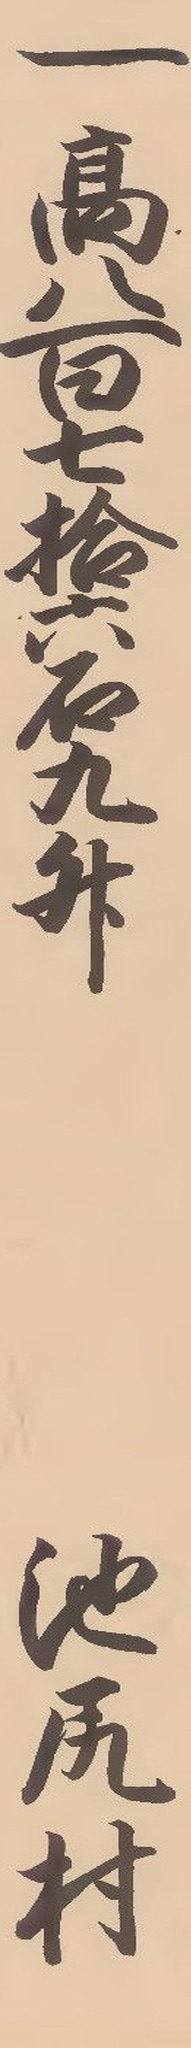一髙八百七拾六石九升池尻村
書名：豊前国郷帳
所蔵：国立公文書館 National Archives of Japan
